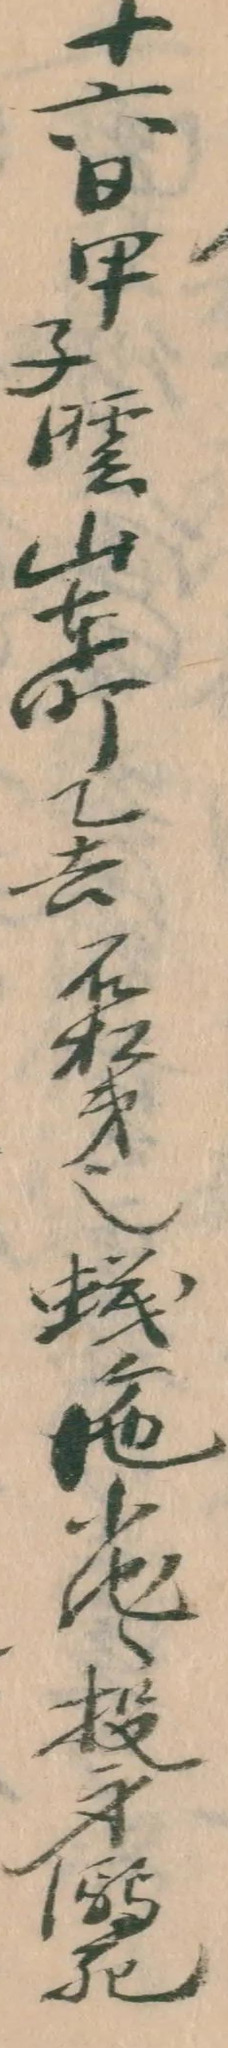十六日甲子曇山本町乙吉石松弟也蟻ケ池小池へ投身溺死
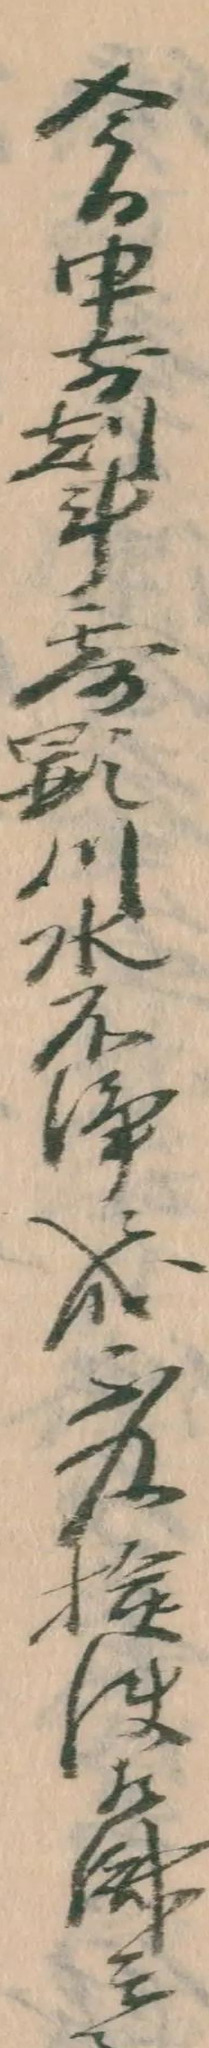今日申前刻斗露顕川水不浄ニ成不及検使相済云々
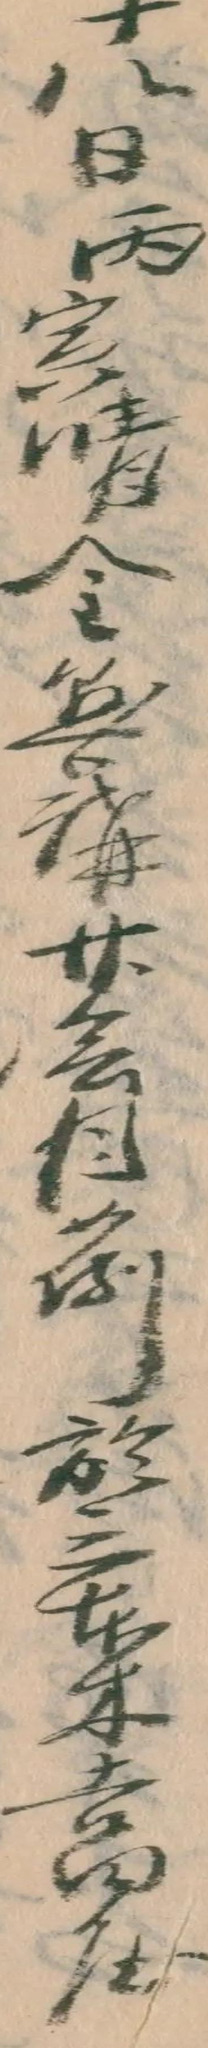十八日丙寅晴金懸御構廿會目如例於三本木吉田屋
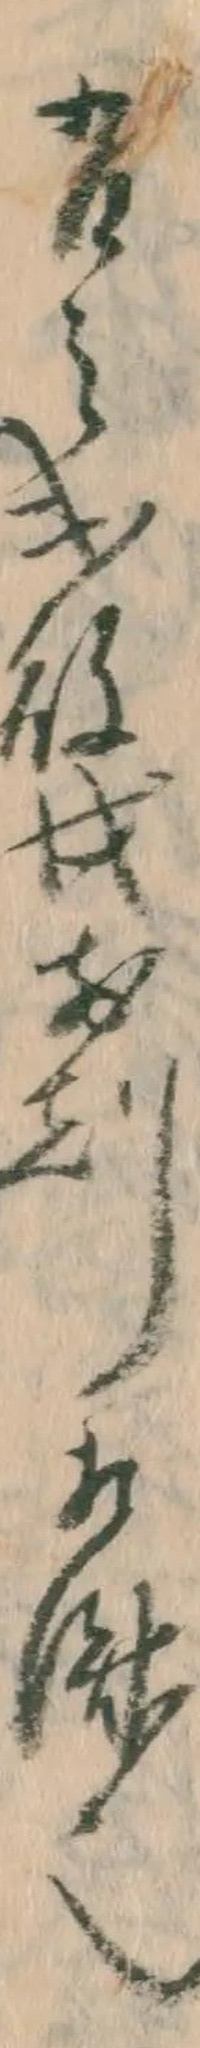有之出役戌前刻相済也
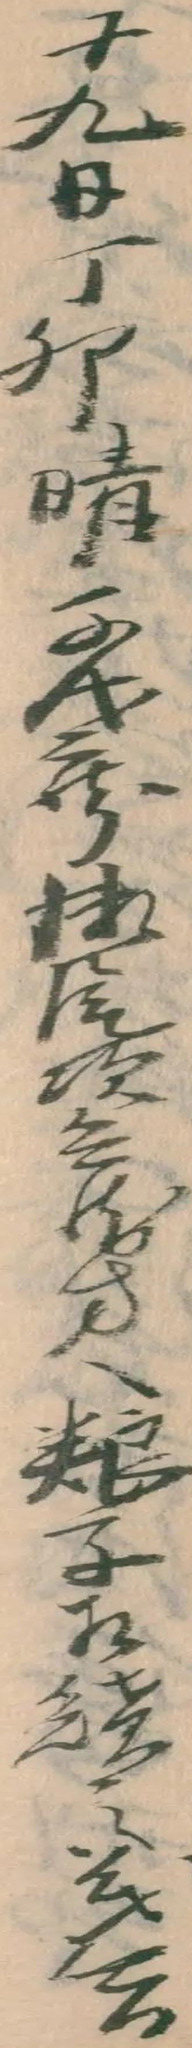十九日丁卯晴千代蔵瀬尾次兵衛方へ養子相續之義今日
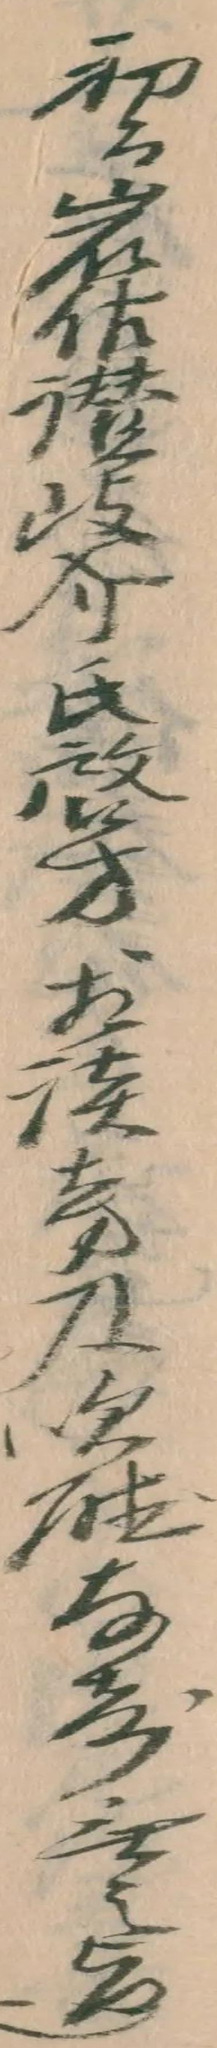初而岩佐讃岐介氏啓方へ相談旁及吹聴存寄無之旨也
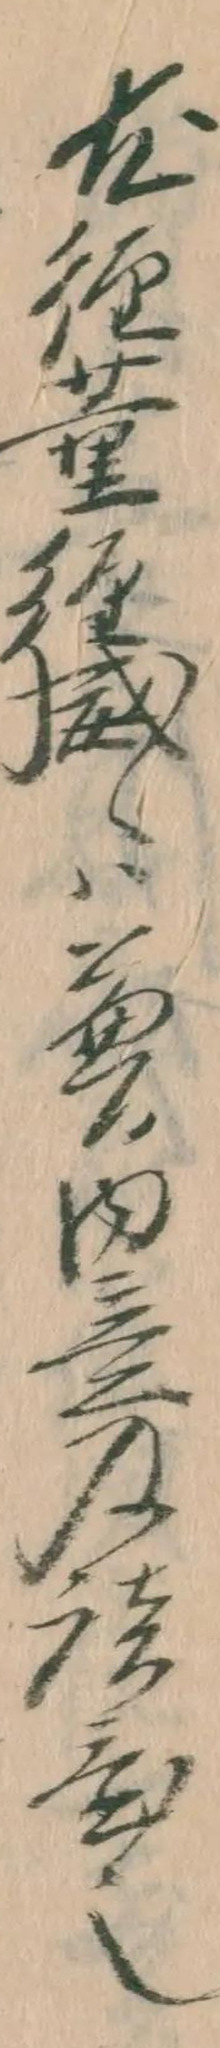尤経董経威へハ兼而内意及諸置之
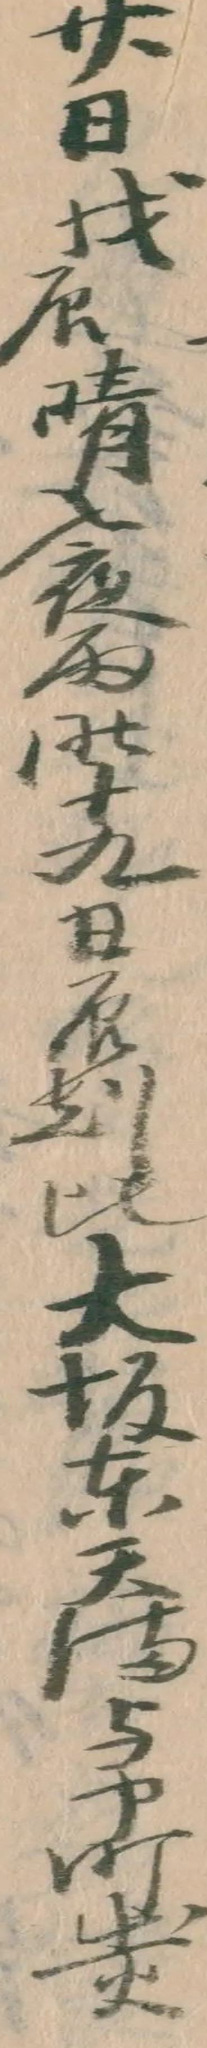廿日戊辰晴入夜雨昨十九日辰刻比大坂東天満と申町出火
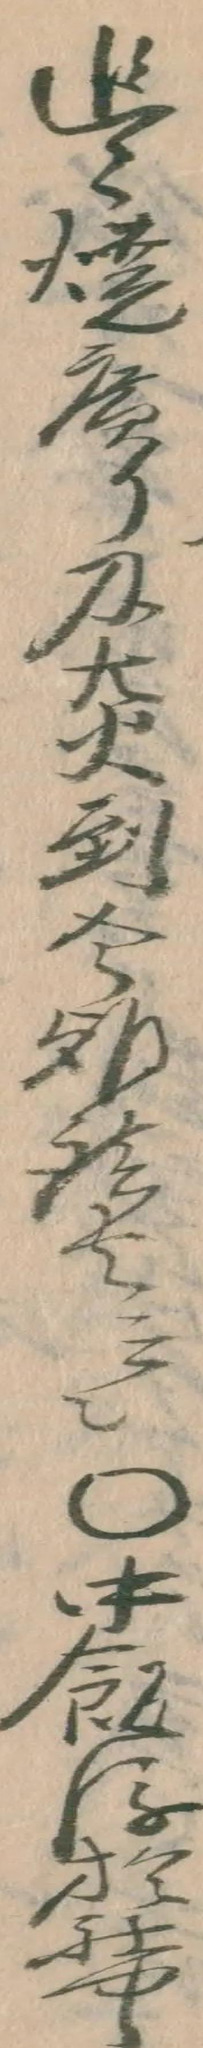追々焼廣り及大火到今朝鎮火云々○中飯後於社中
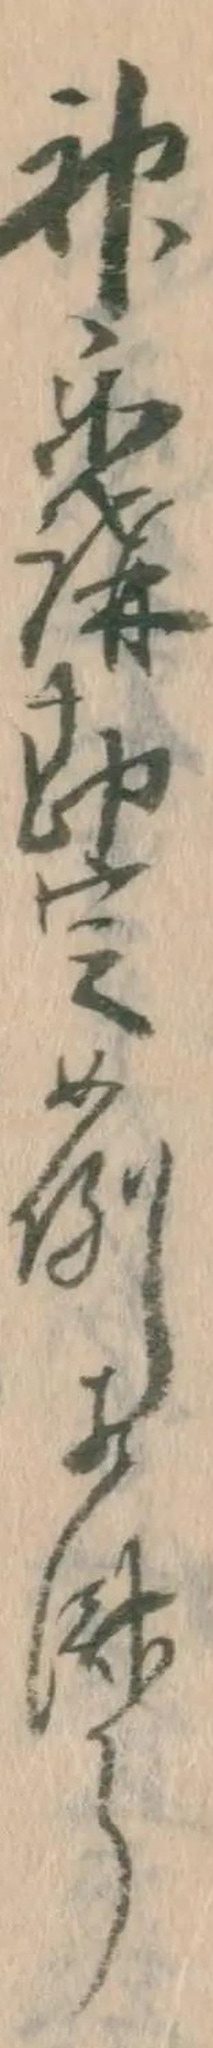神楽講勘定如例相済了
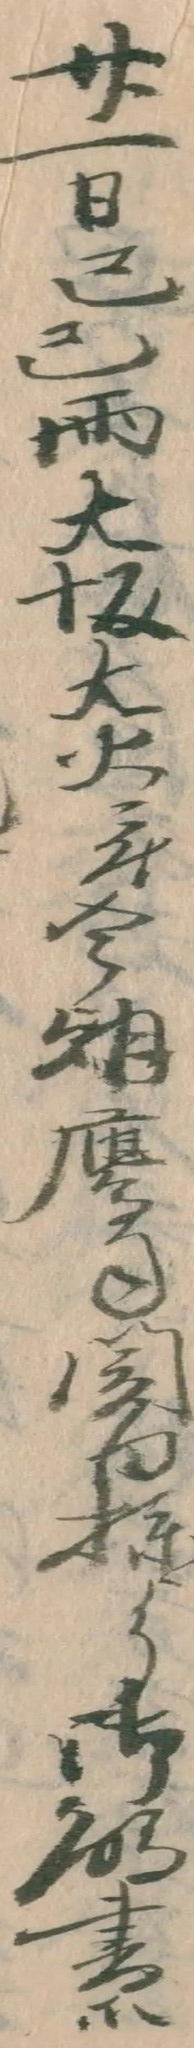廿一日己巳雨大坂大火ニ付今朝鷹司関白様より御觸書御
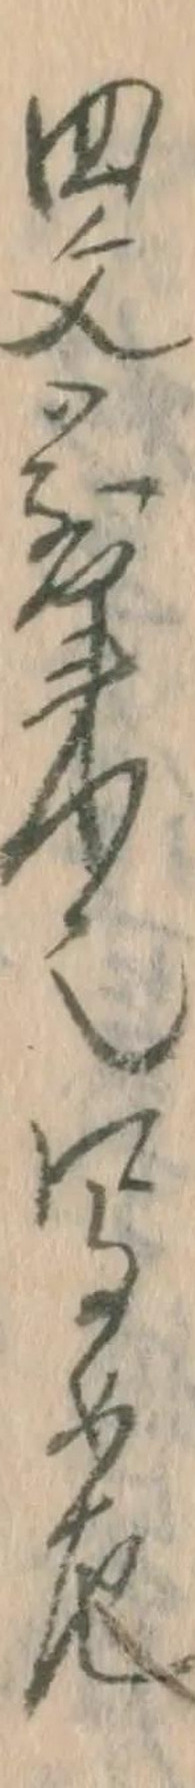回文御到来也写如左
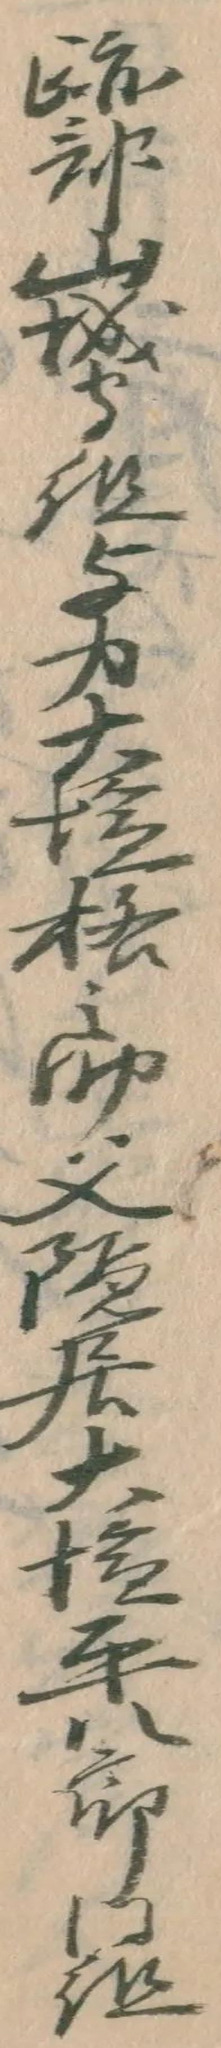跡部山城守組与力大塩格之助父隠居大塩平八郎同組
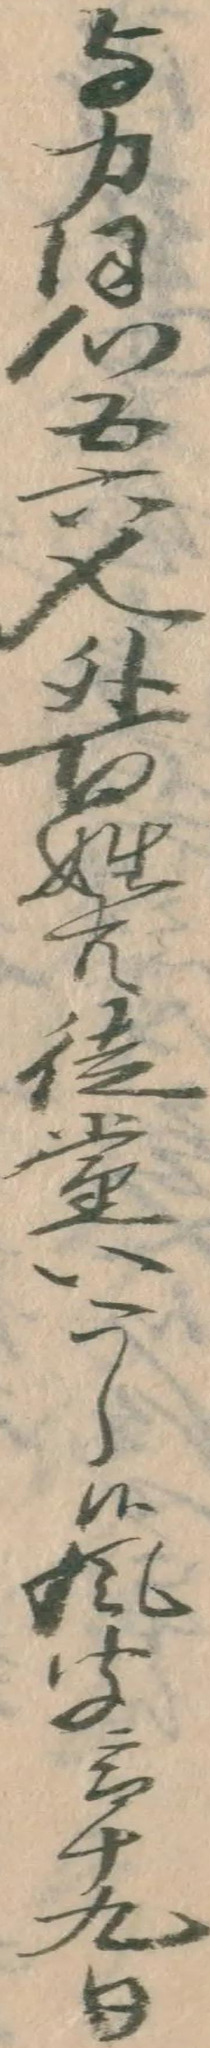与力同心五六人外百姓共徒党いたし候風聞ニ而十九日
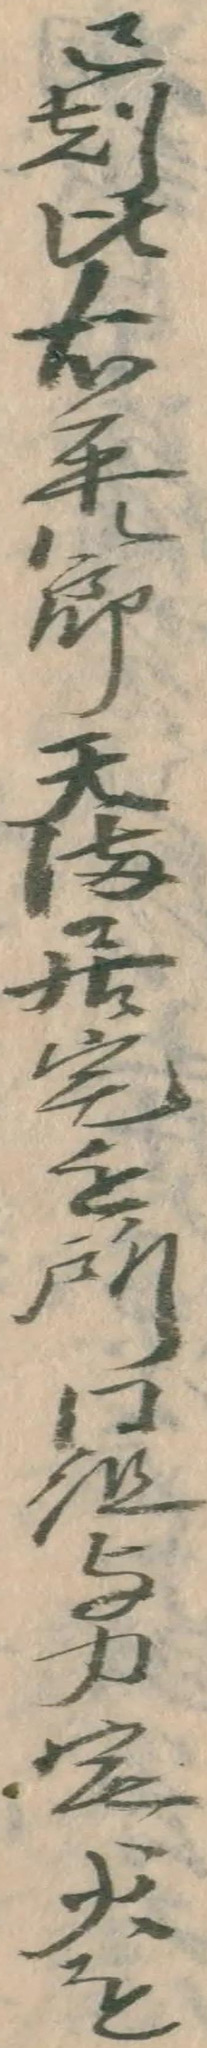巳刻比右平八郎天満居宅近所同組与力宅へ火を
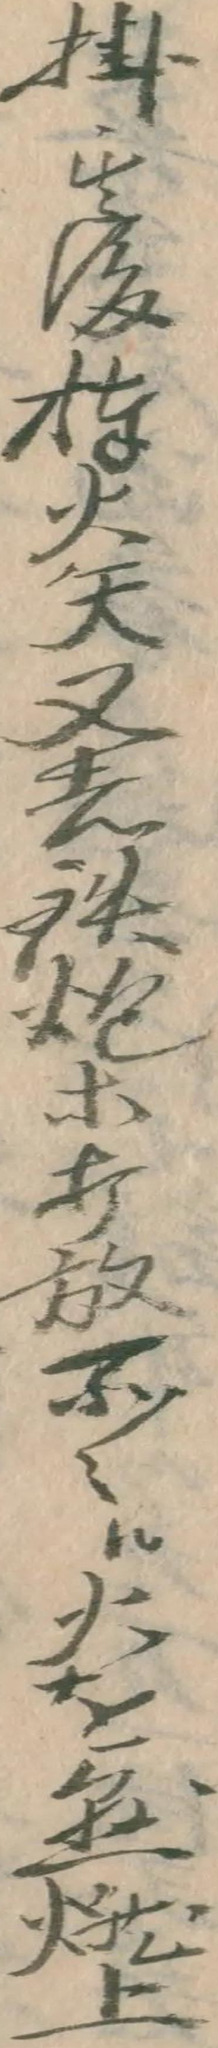掛其後棒火矢又者鉄炮等打放所〻江火を懸燃上
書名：賀茂社記録. 第67冊
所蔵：国立国会図書館 National Diet Library, JAPAN
